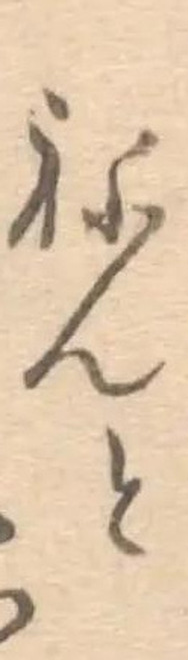ねんと
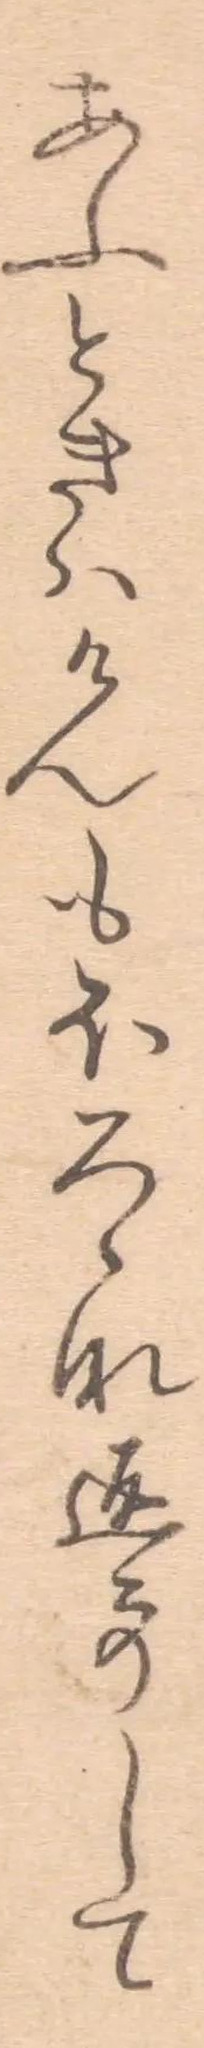あふときはけんもほろゝな返事して
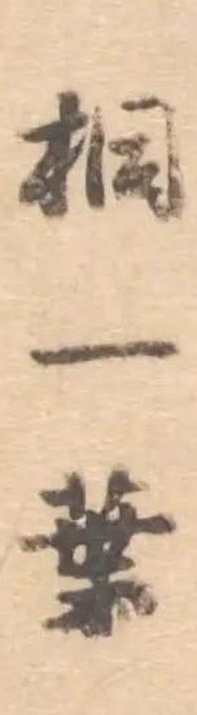桐一葉
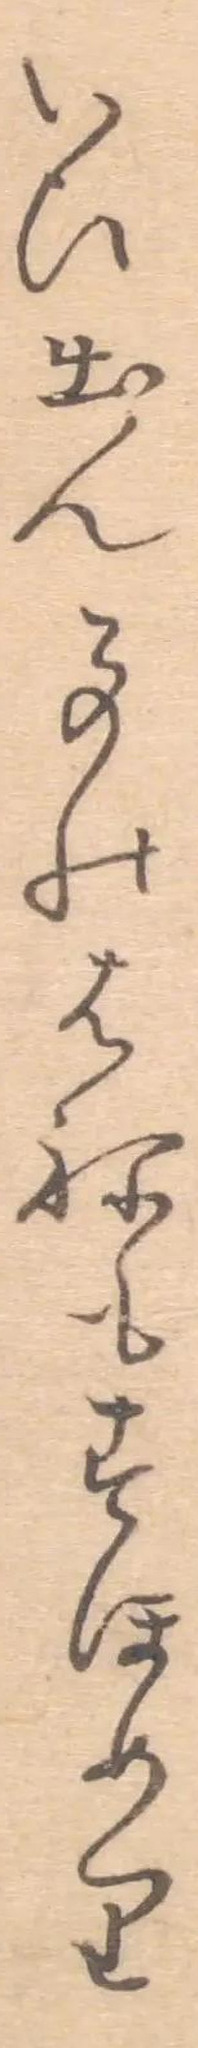いひ出ん事のはねもすほめり

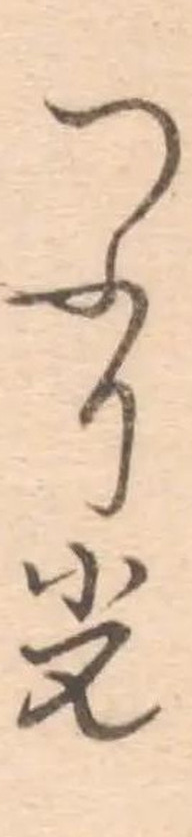つふり光
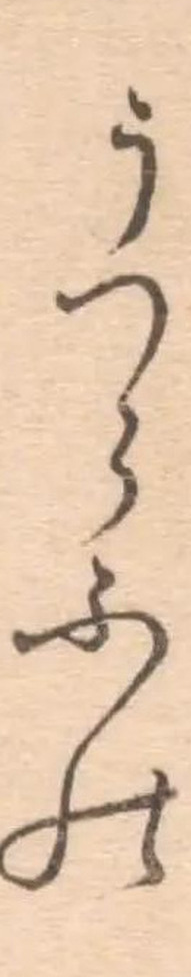うつらふの
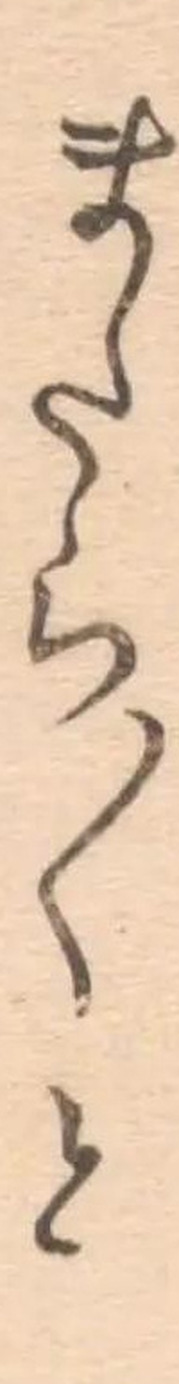またら〳〵と
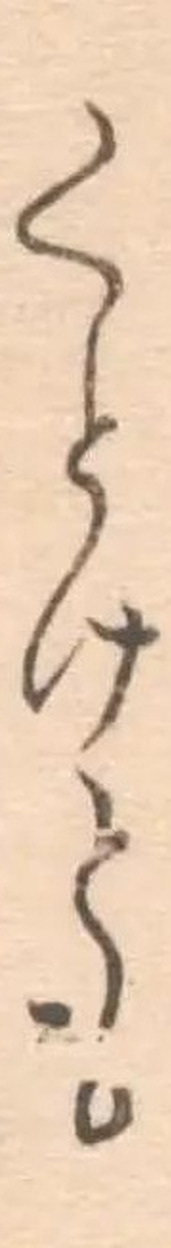くとけとも
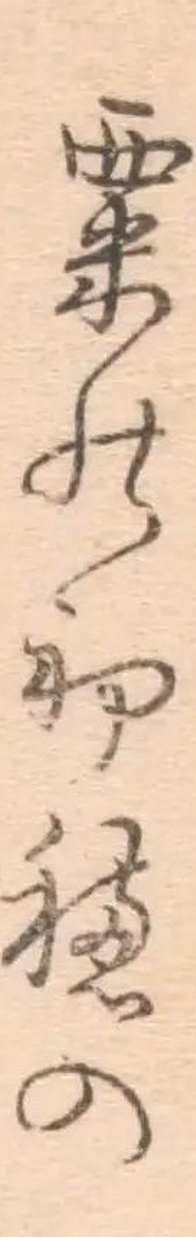粟の初穂の
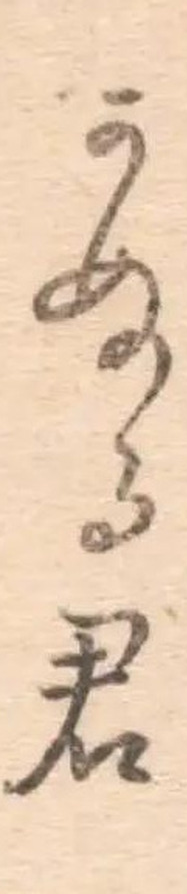かぬる君
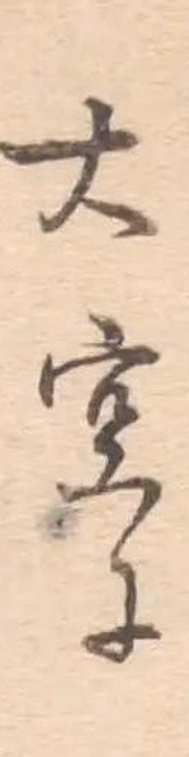大空に
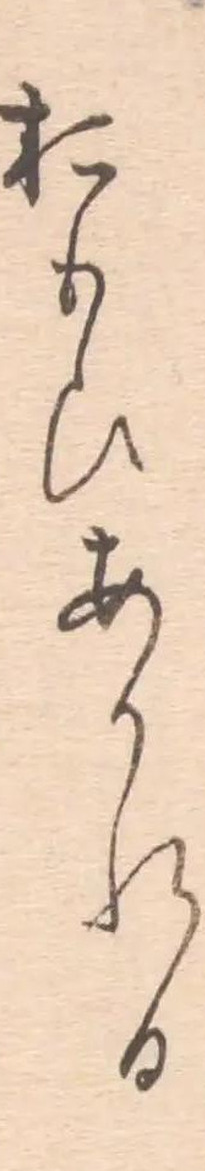おもひあかれる
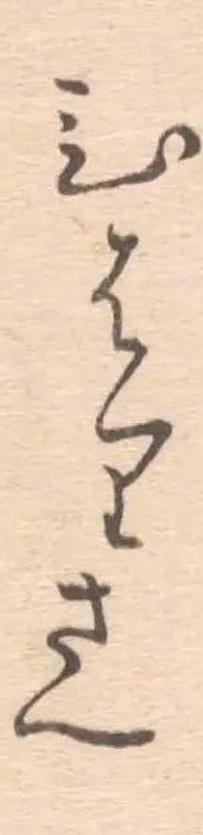ひはりさへ
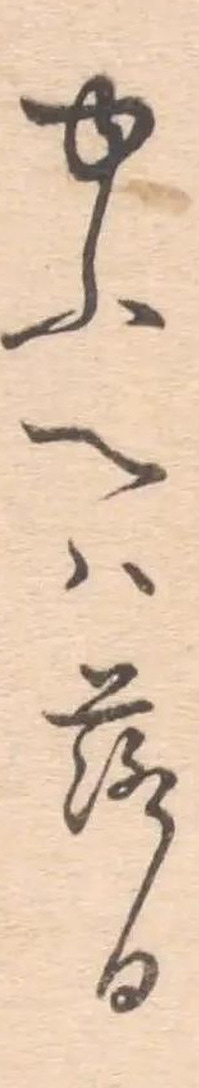ゆふへは落る
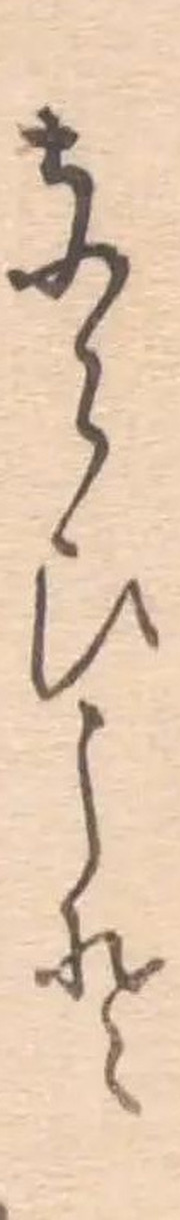ならひこそ
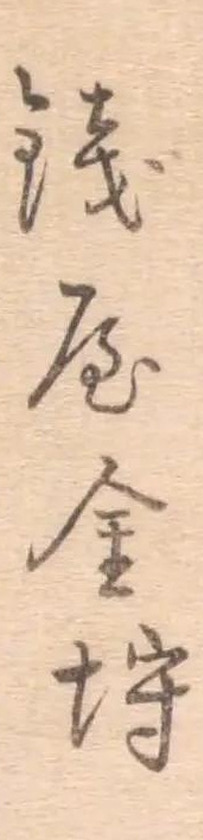銭屋金垨
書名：絵本百千鳥. 1
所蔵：国立国会図書館 National Diet Library, JAPAN
